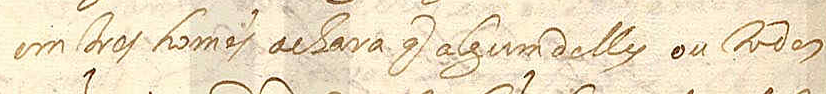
em tres homēs achara q̄ algum delles ou todos
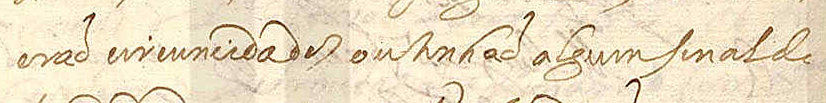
eraõ circuncidados ou tinhaõ algum sinal de
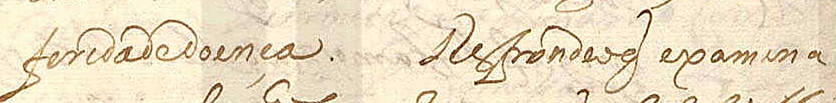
ferida de doença. Respondeo q̄ examina
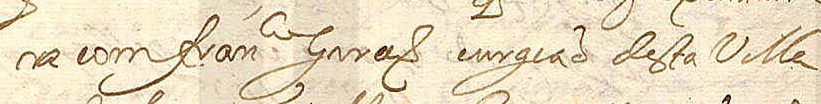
ra com fran.co Giraõ curgiaõ desta Villa
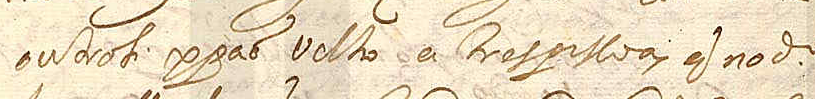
outrosi xpaõ velho a tres pessoas q̄ no d.o
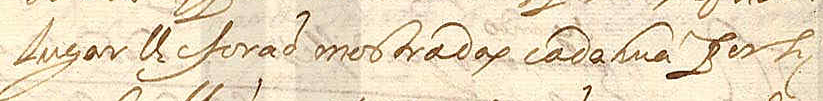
lugar lhe foraõ mostradas cada huā per sy
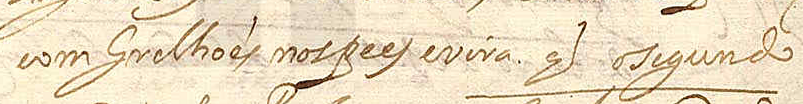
com Grelhoẽs nos pees e vira q̄ o segundo
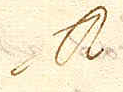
o R
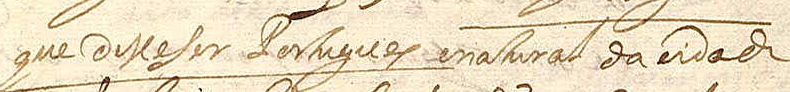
que disse ser Portugues e natural da cidade
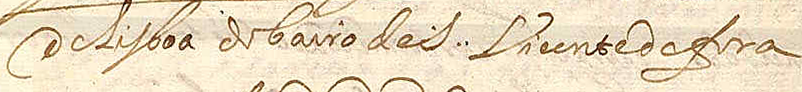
de Lisboa do bairo de S. Vicente de fora
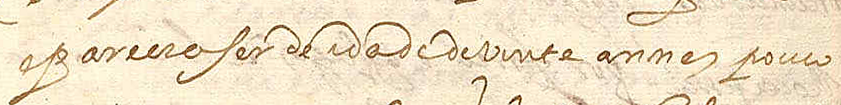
e parecia ser de idade de vinte annos pouco
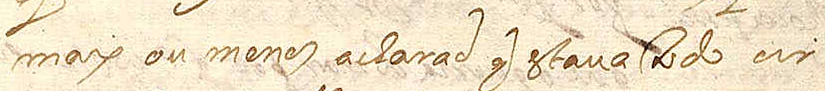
mais ou menos acharaõ q̄ estaua todo cir
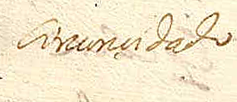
circuncidado
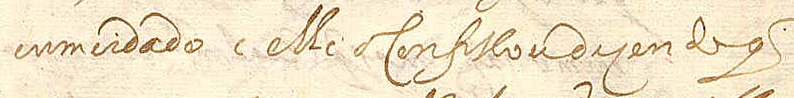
cumcidado e elle o Confessou dizendo q̄
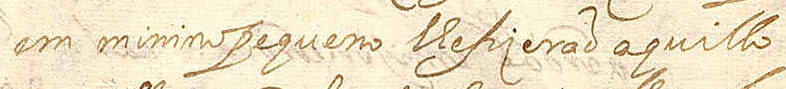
em minino pequeno lhe fizeraõ aquillo
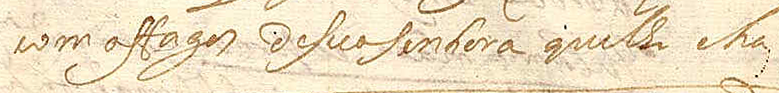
com affagos de sua senhora que lhe cha
